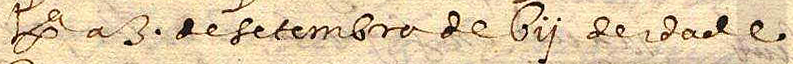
Lxa a 3 de setembro de bij de idade
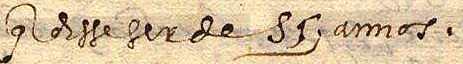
q̄ disse ser de 55 annos.
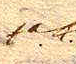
ta. 4.
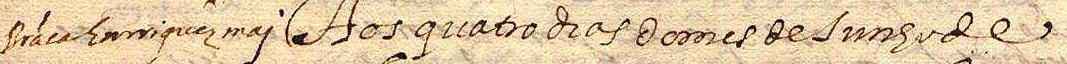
Brāca Enrriquez maj Aos quatro dias do mes de Iunho de
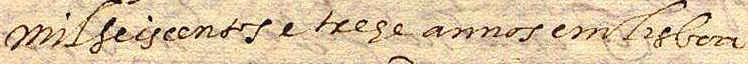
mil seiscentos e treze annos em Lisboa
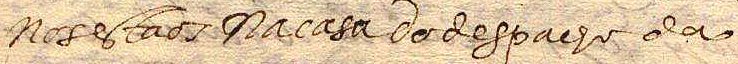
nos estaos na casa do despacho da
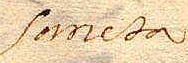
Sancta
